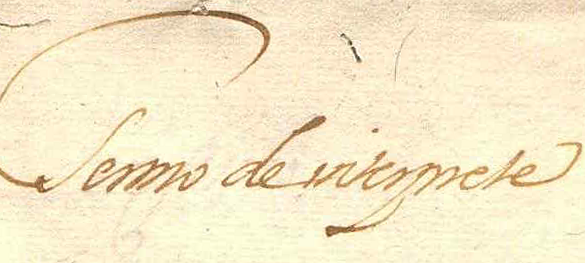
Termo de interprete
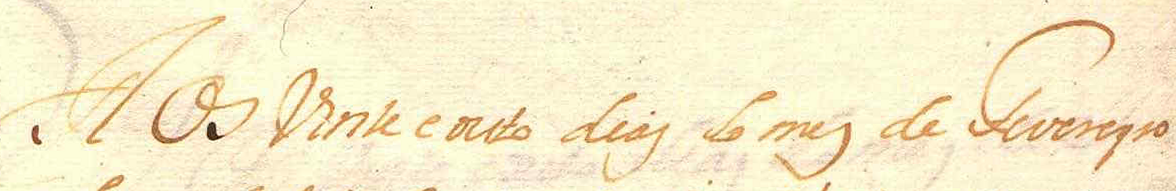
Aos Vinte e outo dias do mez de Feverejro
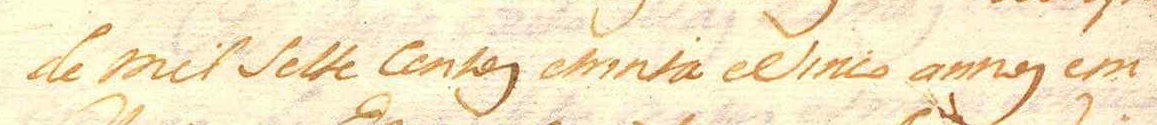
de mil settecentos e trinta e sinco annos em
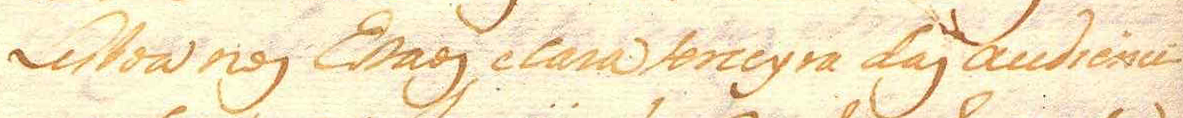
Lisboa nos Estaos, e caza terceyra das audienci
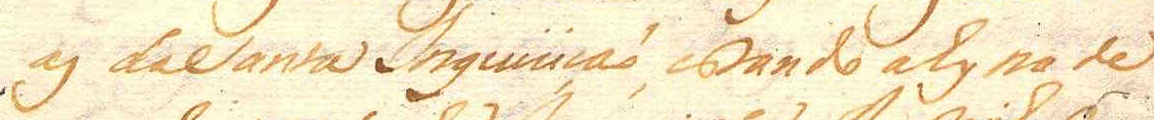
as da Santa Inquiziçaõ, estando ahy no de
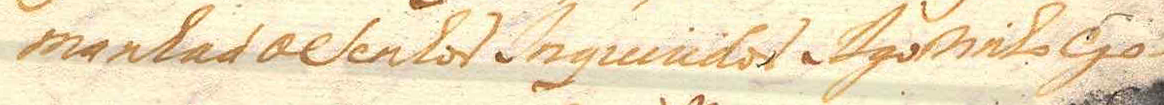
manhaã o Senhor Inquizidor Agostinho Go
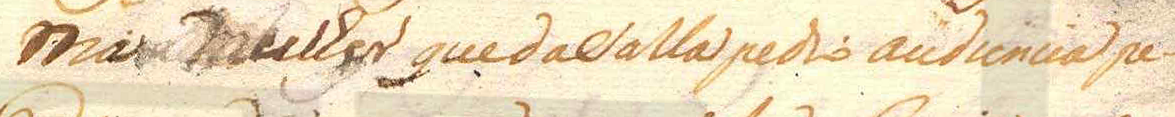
ma mulher que da salla pedio audiencia pe
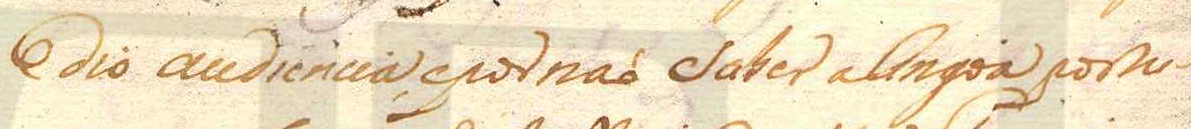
edio audiencia, e por nao saber a lingoa portu
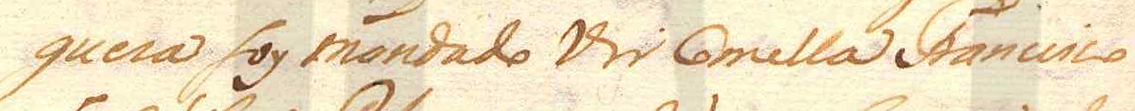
gueza foy mandado vir Com ella Francisco
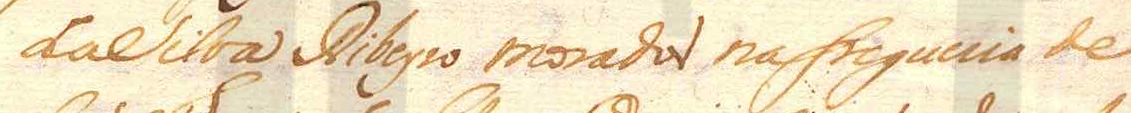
da Silva Ribeyro morador na freguezia de
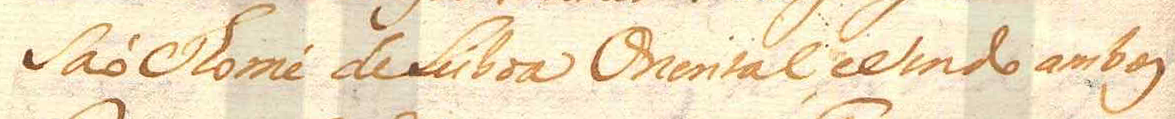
Saõ Thomé de Lisboa Oriental, e sendo ambos
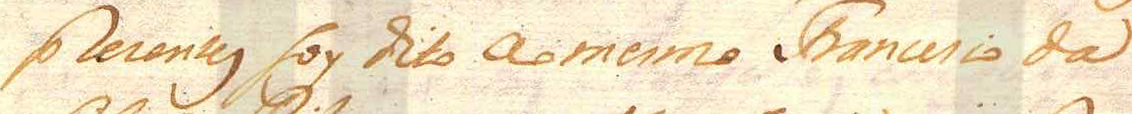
pRezentes foy dito ao mesmo Francisco da
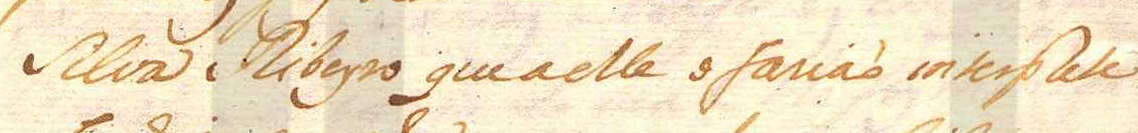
Silva Ribeyro que a elle o faziaõ interpRete
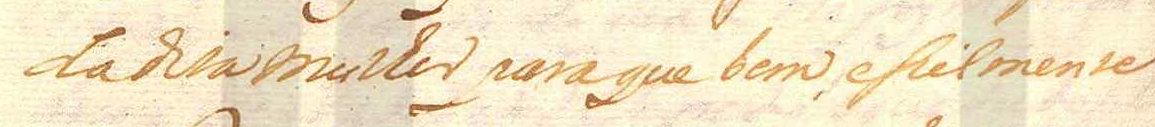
da dita mulher para que bem, e fielmente
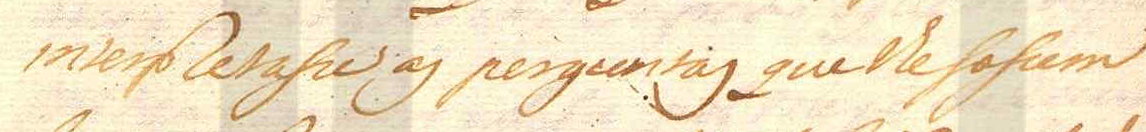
interpRetasse as perguntas que lhe fossem
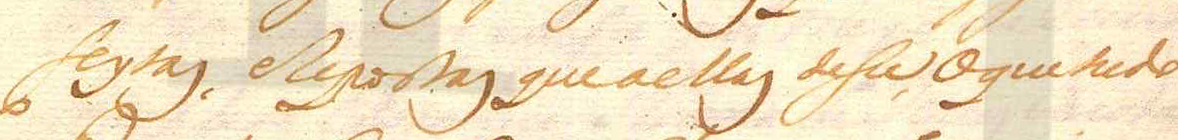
feytas, e Repostas que a ellas desse, o que tudo
